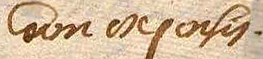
Cum expensis.
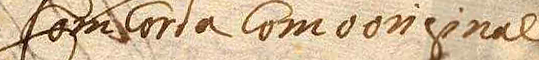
Comcorda com o original
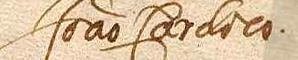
João Cardozo.
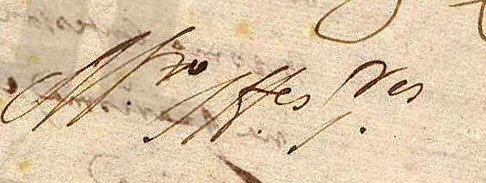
M.to Ill.es s.res
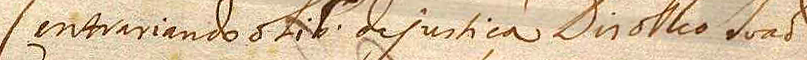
Contrariando o Lib.o de justiça Dis o Reo Ioaõ
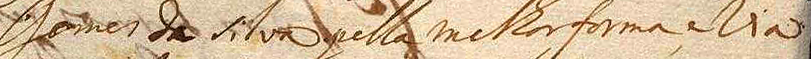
Gomes da silva pella melhor forma, e via
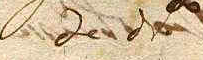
de dr.to
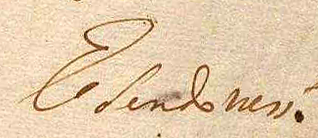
E sendo ness.o
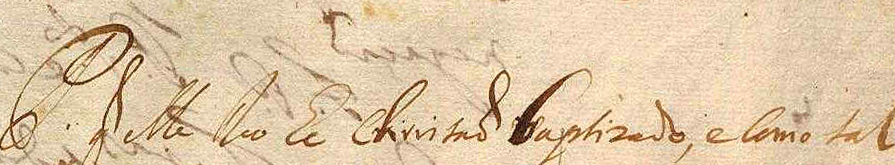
P. q̄ elle Reo he christaõ baptizado, e como tal
